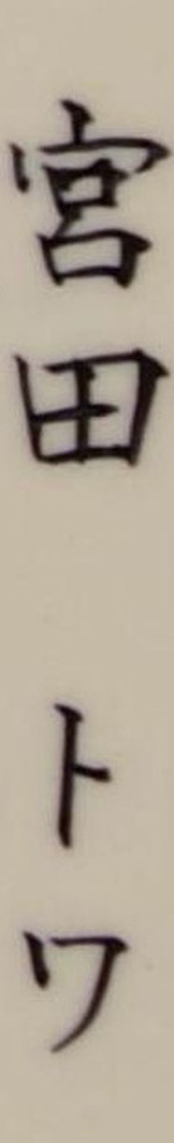宮田トワ
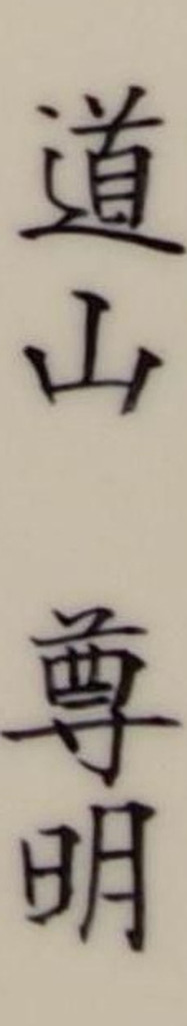道山尊明
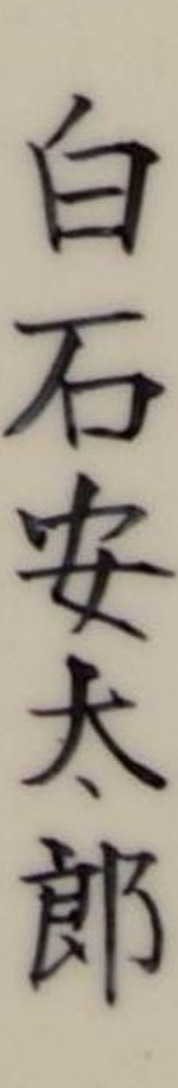白石安太郎
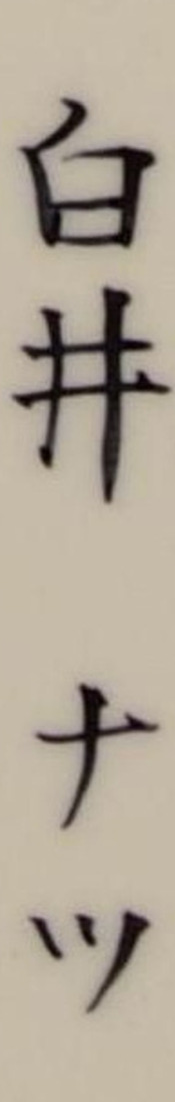白井ナツ
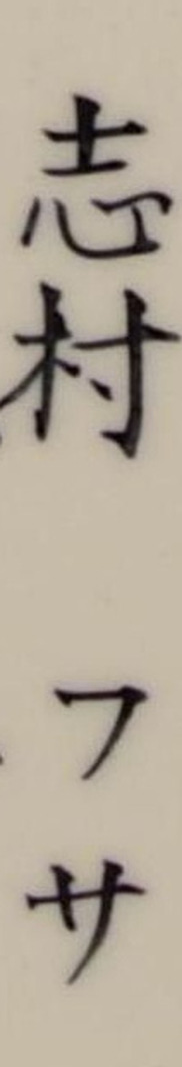志村フサ
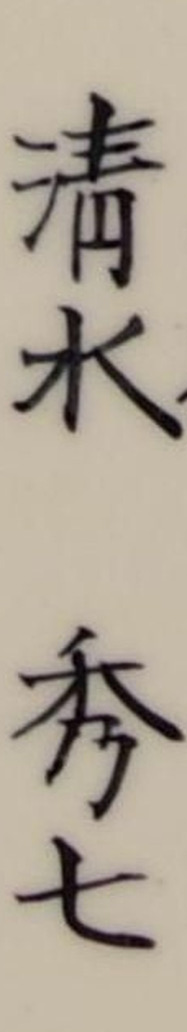清水秀七
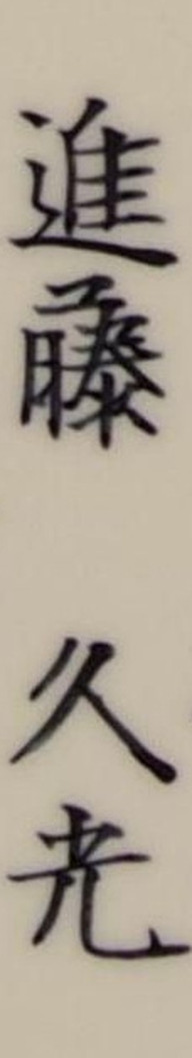進藤久光
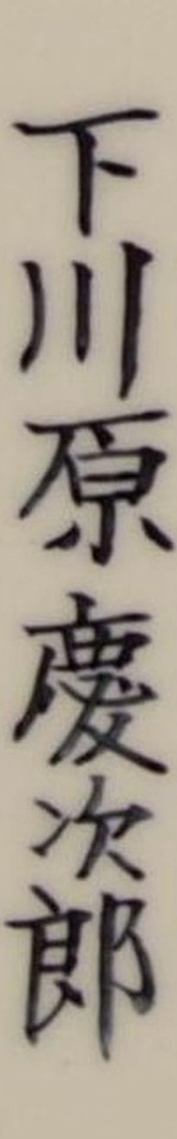下川原慶次郎
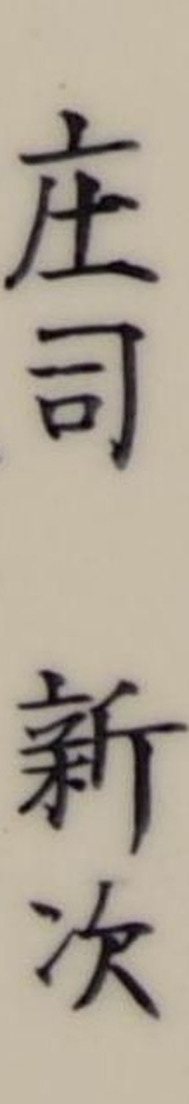庄司新次
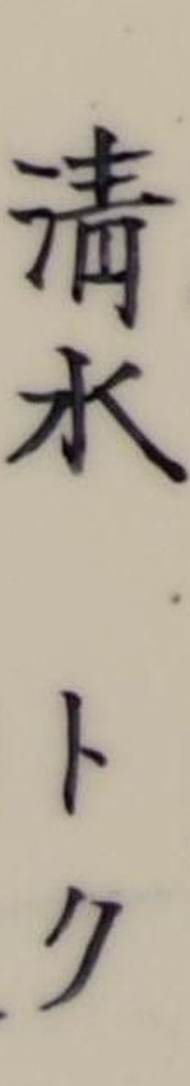清水トク
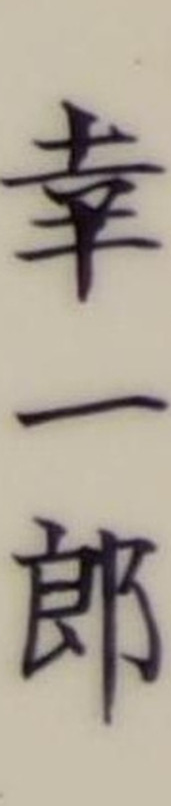幸一郎
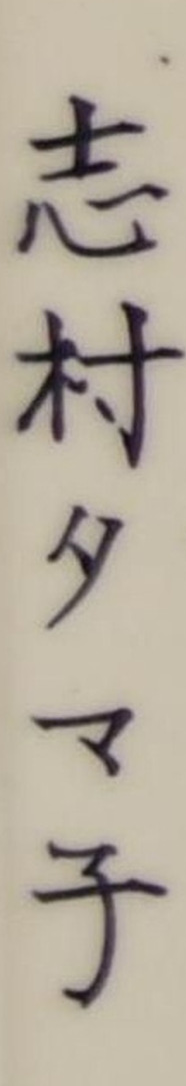志村タマ子

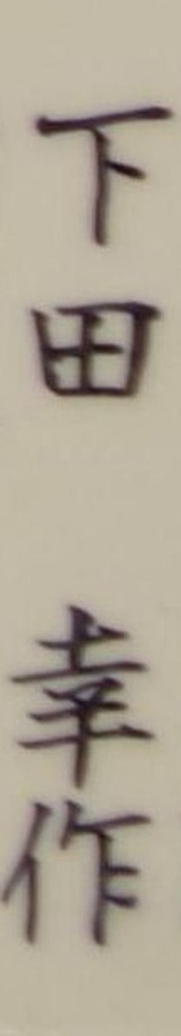下田幸作
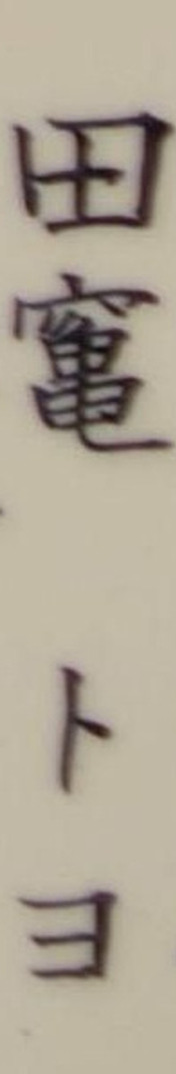田竈トヨ
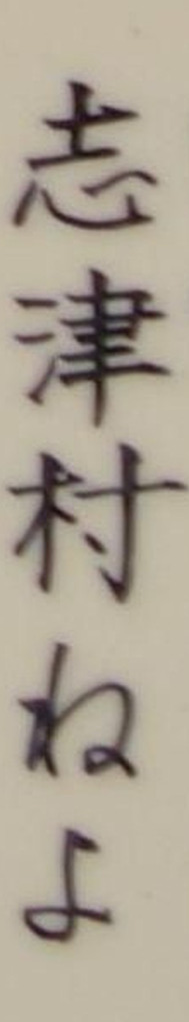志津村ねよ
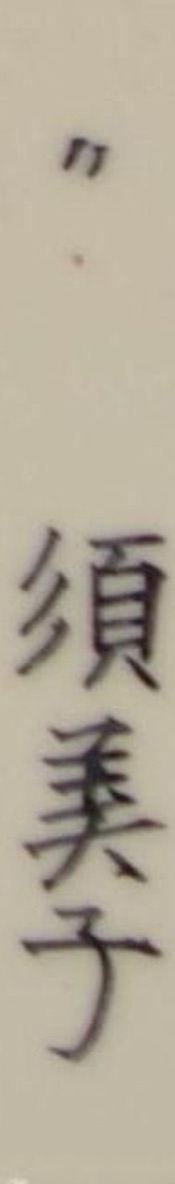須美子
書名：M~S
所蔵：高野山金剛峯寺
